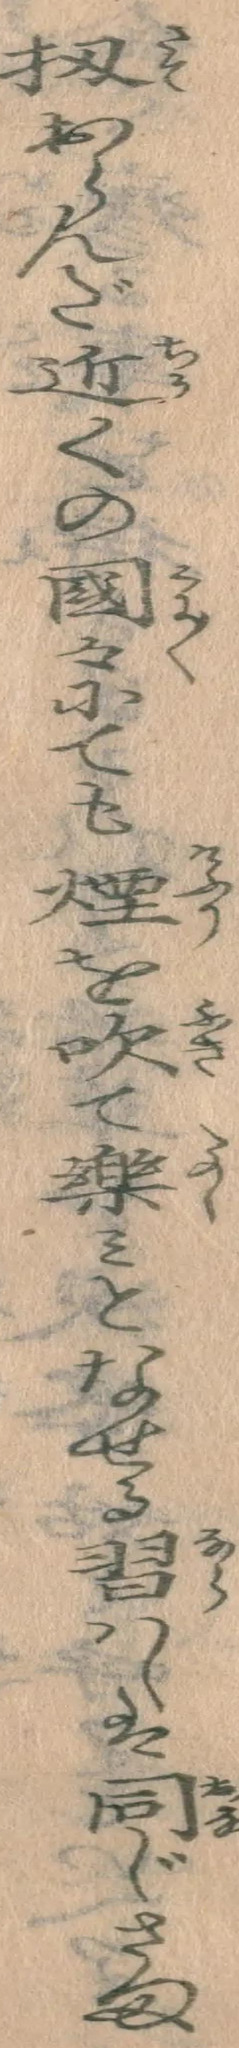扨おらんだ近くの国々にても煙を吹て楽みとなせる習はしは同じさま
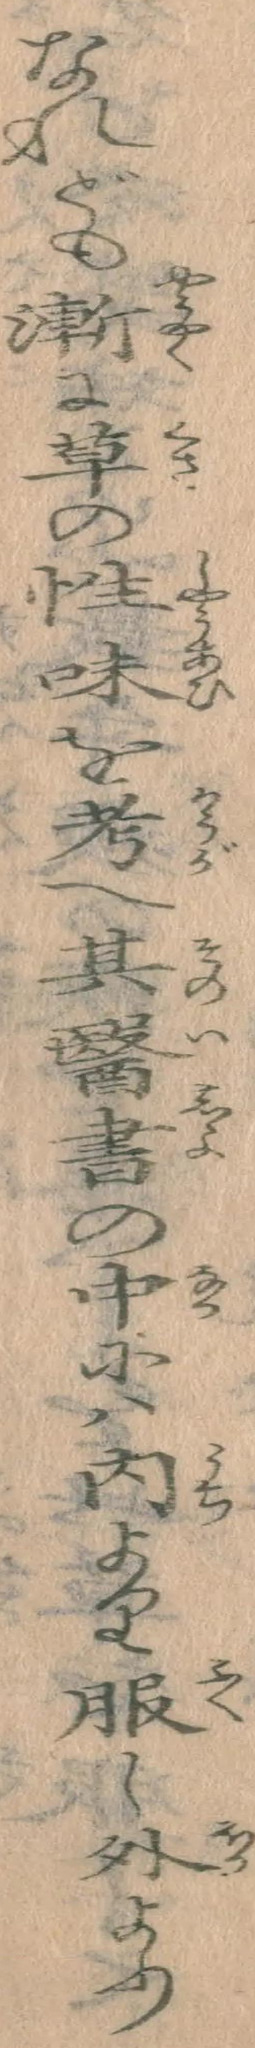なれども漸に草の性味を考へ其医書の中には内より服し外より
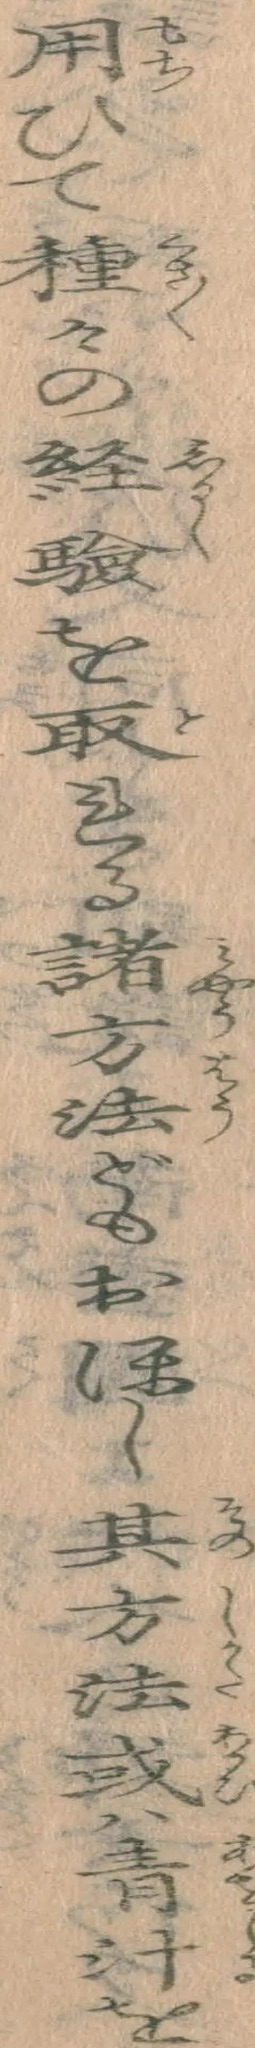用ひて種々の経験を取れる諸方法どもおほし其方法或は青汁を
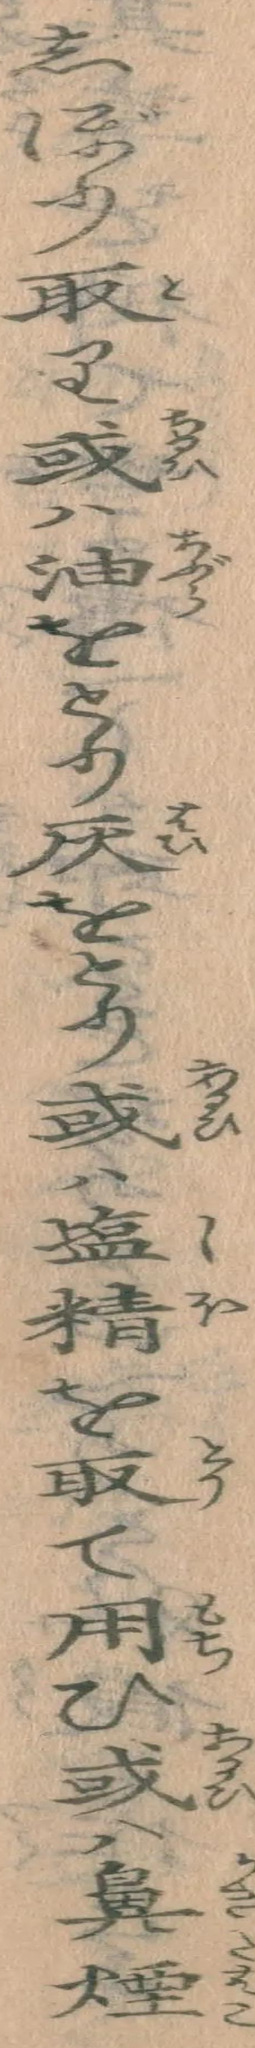しぼり取り或は油をとり灰をとり或は塩精を取て用ひ或は鼻煙
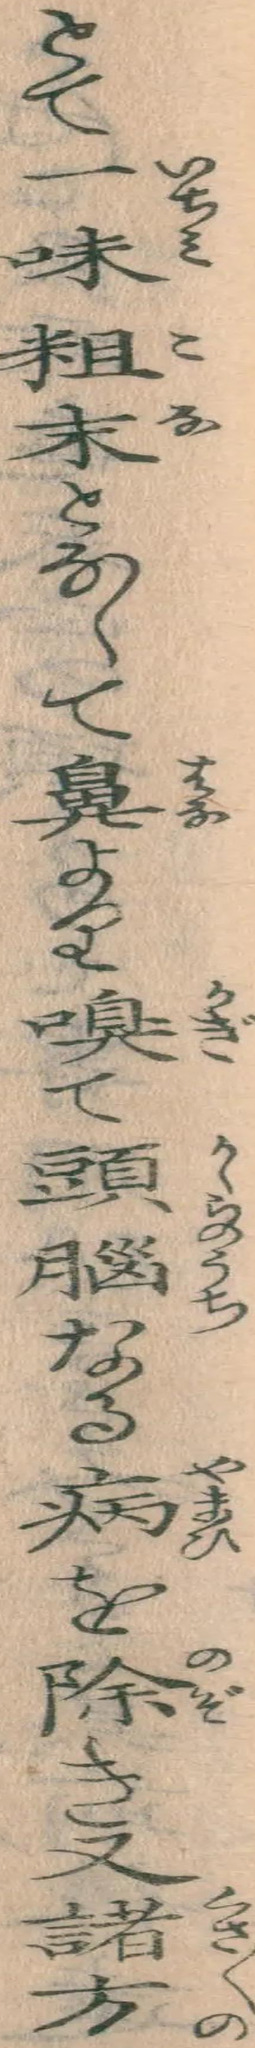とて一味粗末となして鼻より嗅て頭脳なる病を除き又諸方
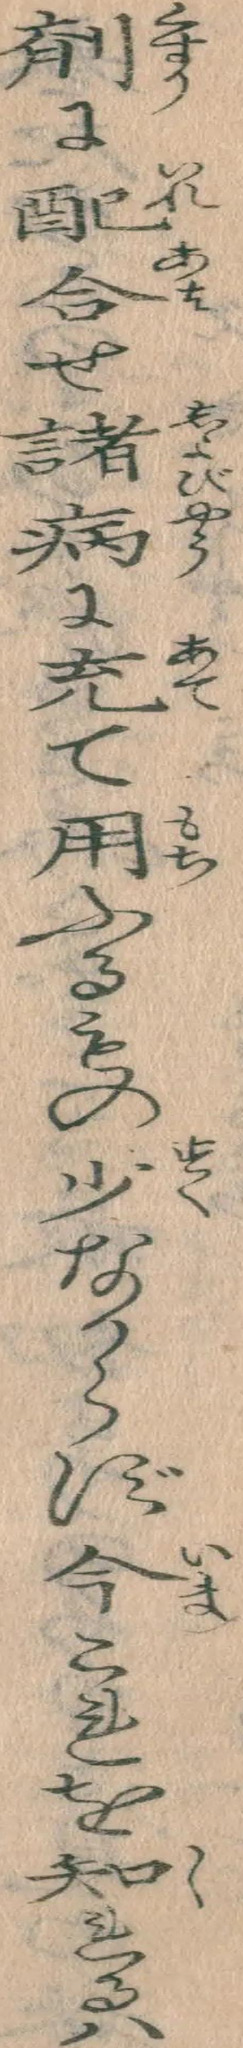剤に配合せ諸病に充て用ふるもの少なからず今これを知れるは
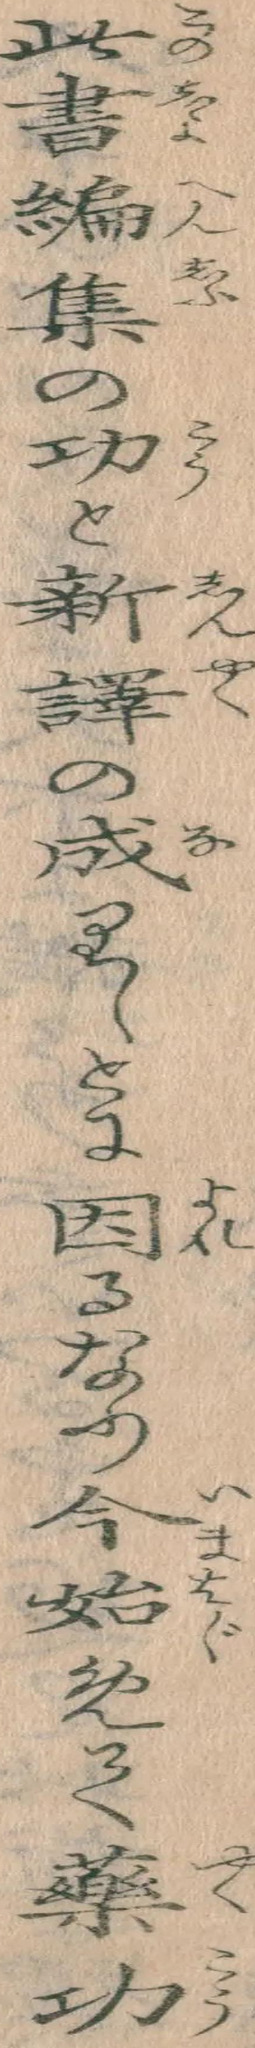此書編集の功と新訳の成りしとに因るなり今始めて薬功
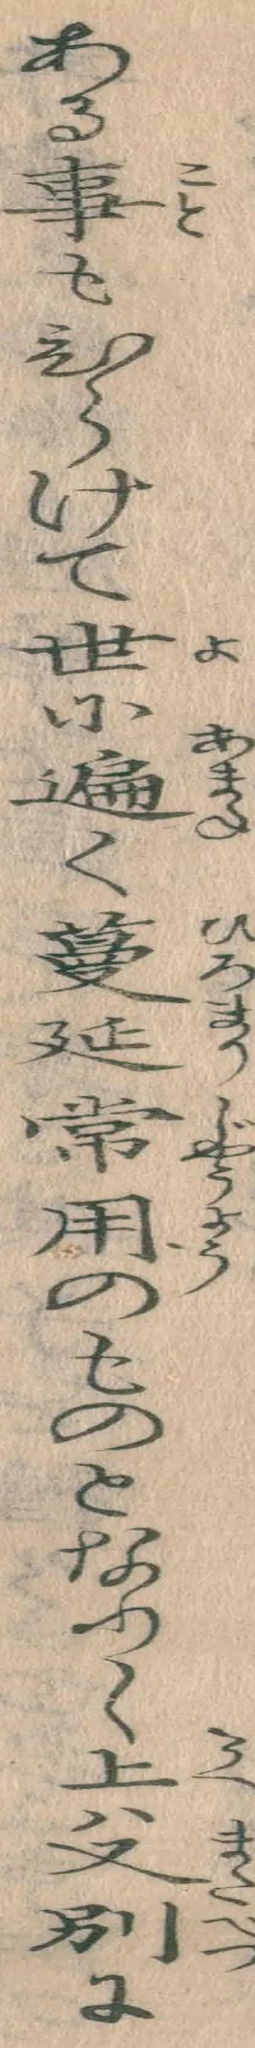ある事もひらけて世に遍く蔓延常用のものとなりし上は又別に
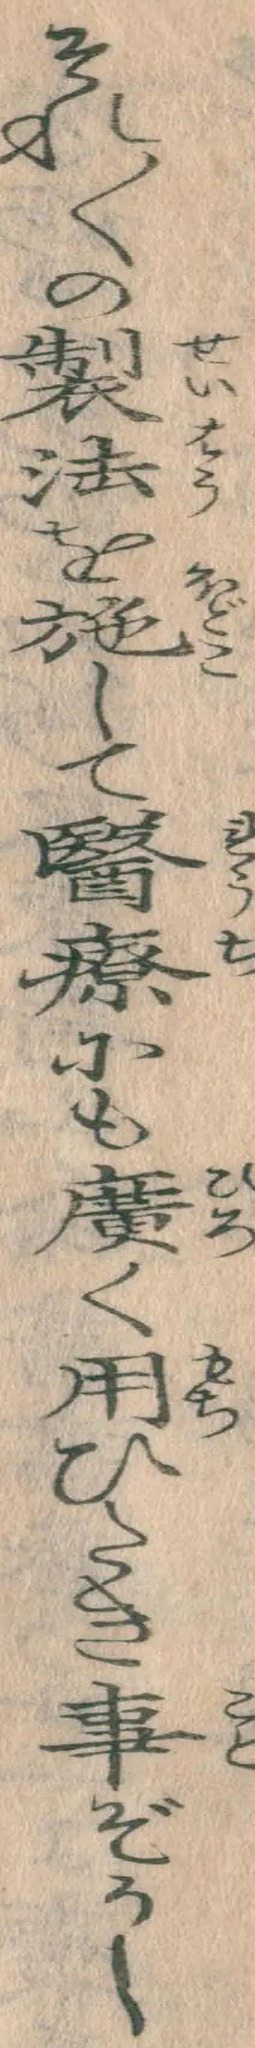それ〳〵の製法を施して医療にも広く用ひたき事ぞかし
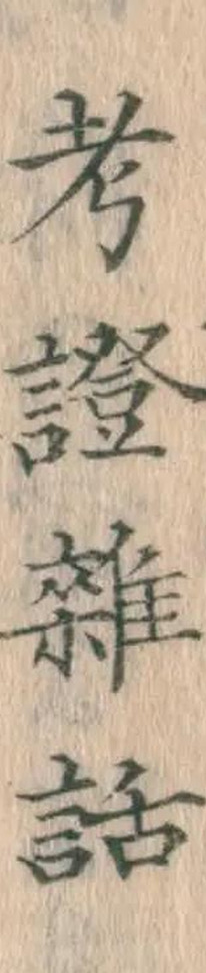考証雑話
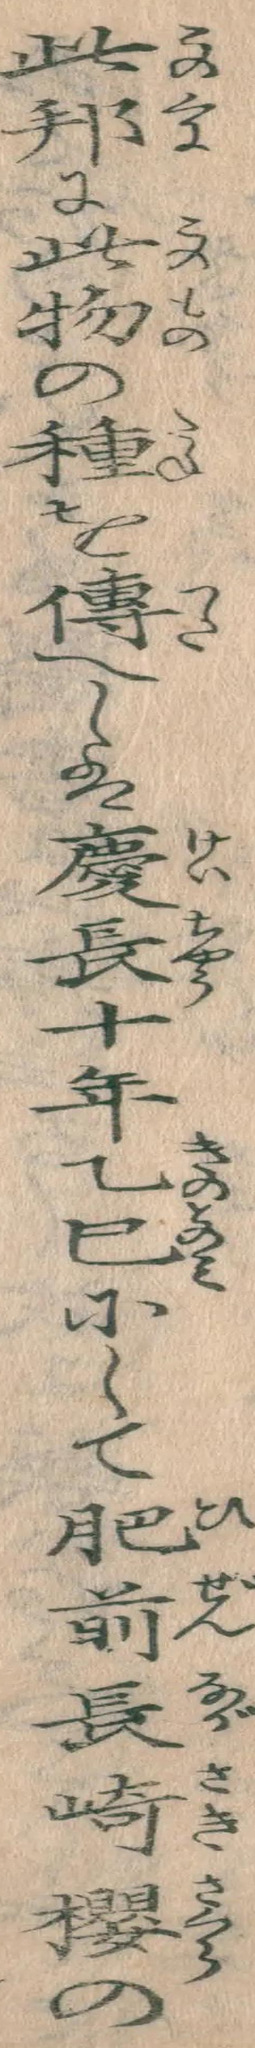此邦に此物の種を伝へしは慶長十年乙巳にして肥前長崎桜の
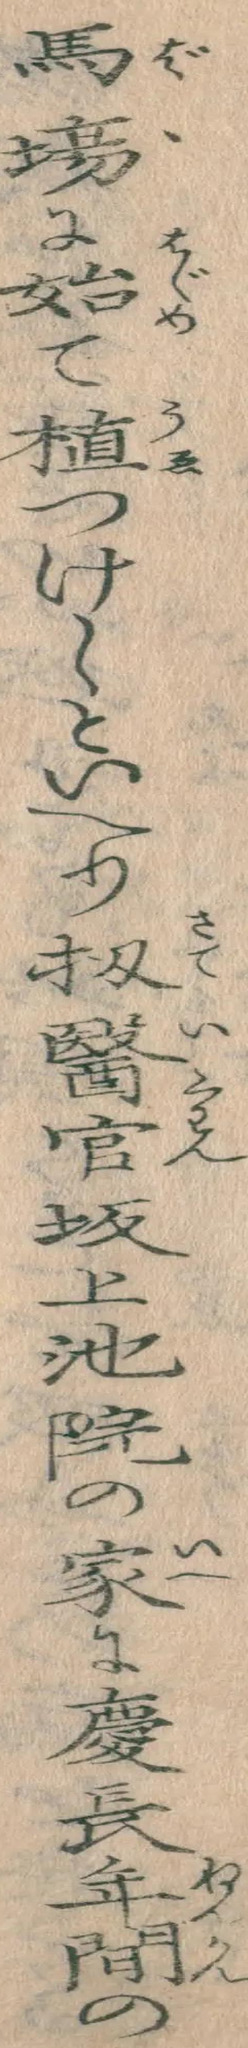馬場に始て植つけしといへり扨医官坂上池院の家に慶長年間の
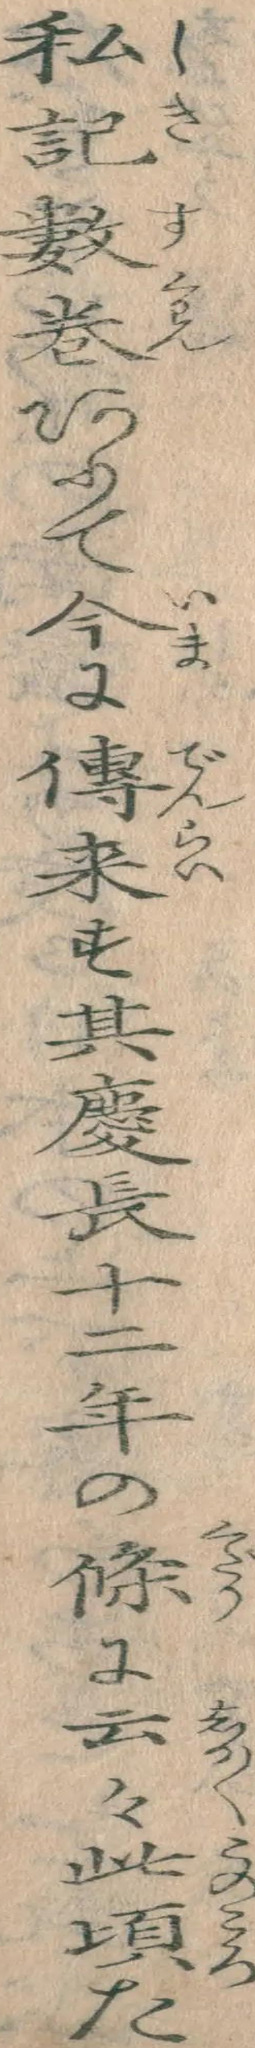私記数巻ありて今に伝来す其慶長十二年の条に云々此頃た
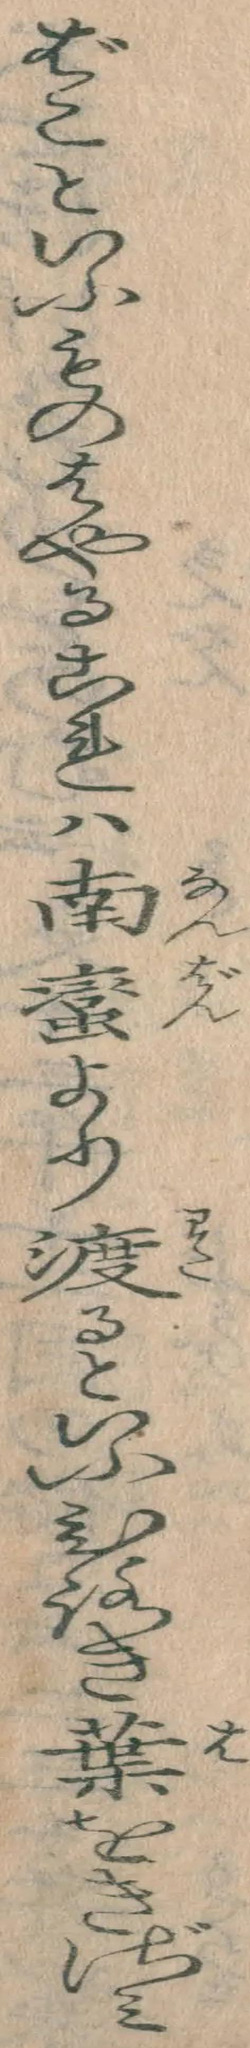ばこといふものはやるこれは南蛮より渡るといふひろき葉をきざみ

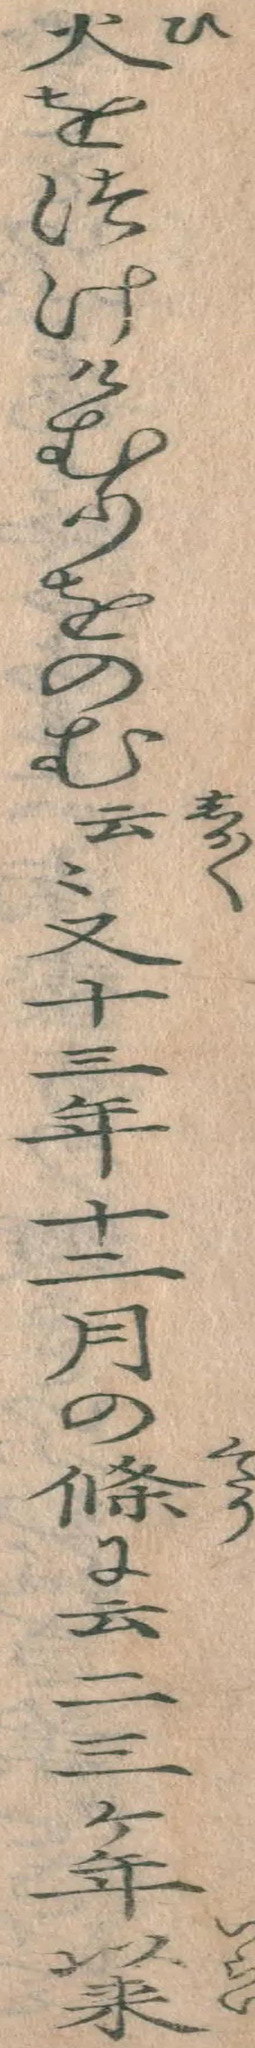火をつけけむりをのむ云々又十三年十二月の条に云二三ヶ年以来
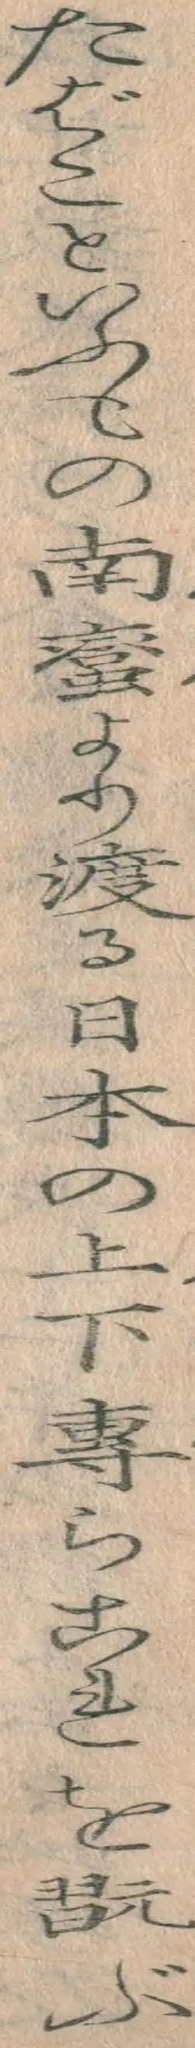たばこといふもの南蛮より渡る日本の上下専らこれを翫ぶ
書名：目さまし草
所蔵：国立国会図書館 National Diet Library, JAPAN
